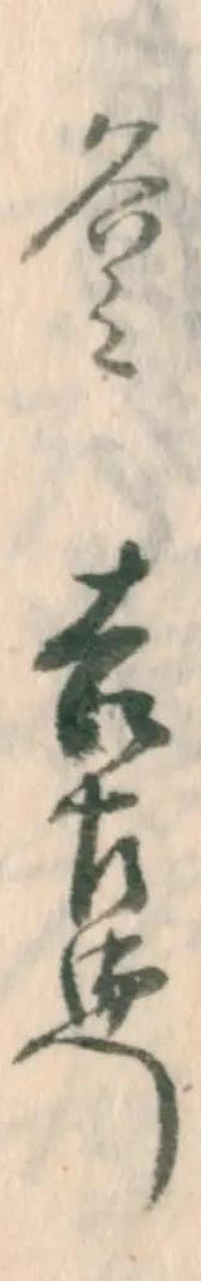名主吉左衛門

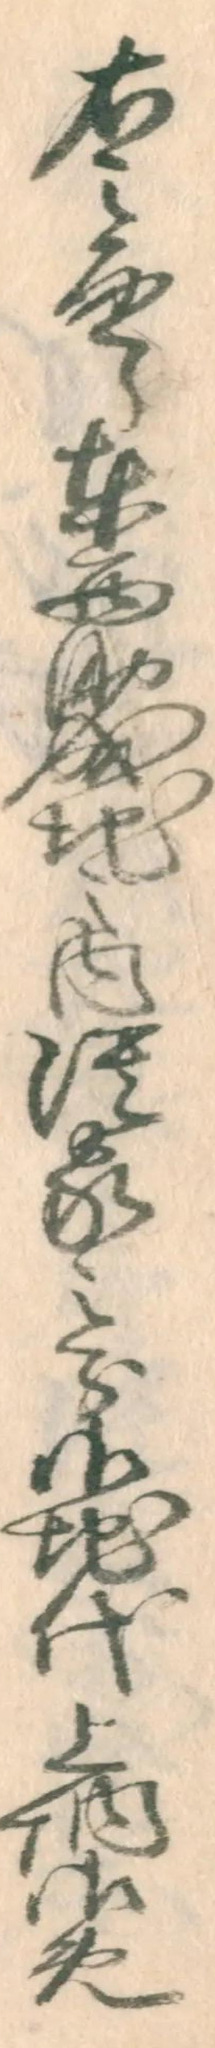右之通り東西助成地之内潰家之分御地代上納御免
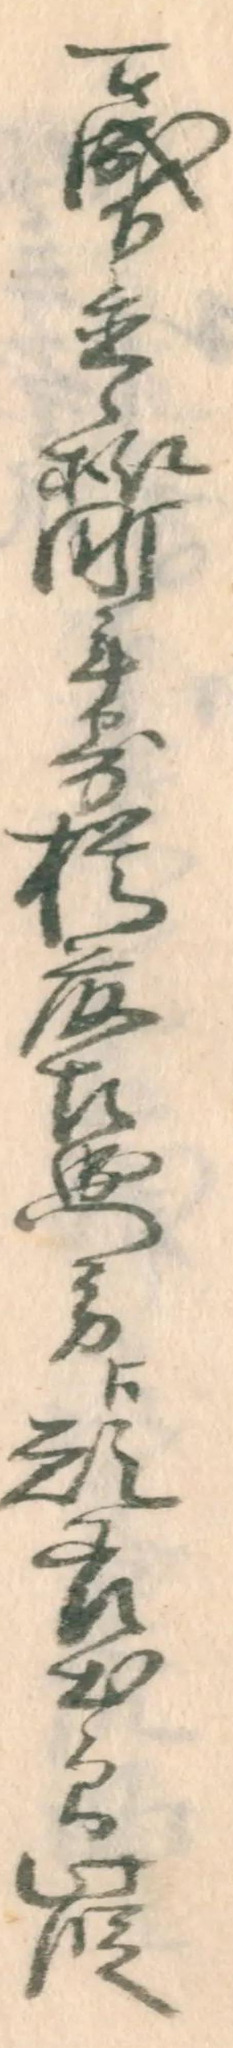被成下置候様町年寄樽藤左衛門方え願差出候間此段
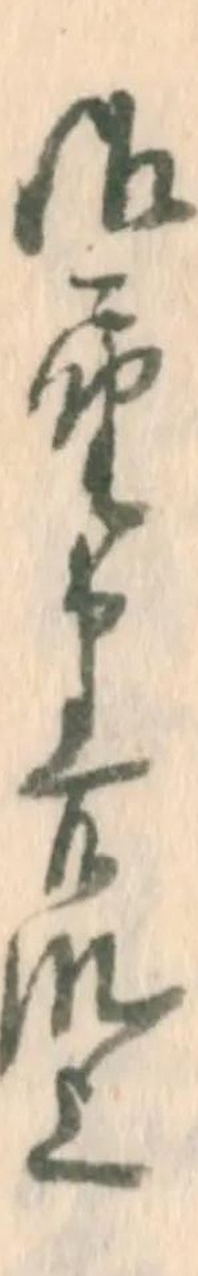御届申上候以上
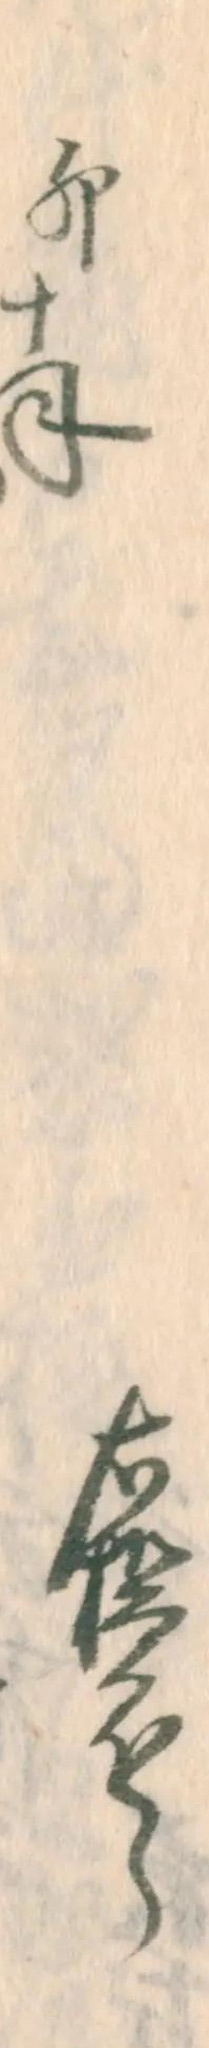卯十月右橋懸リ
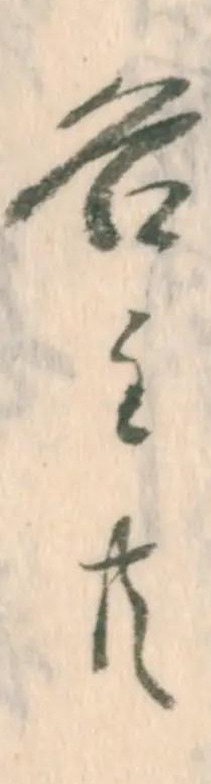名主共
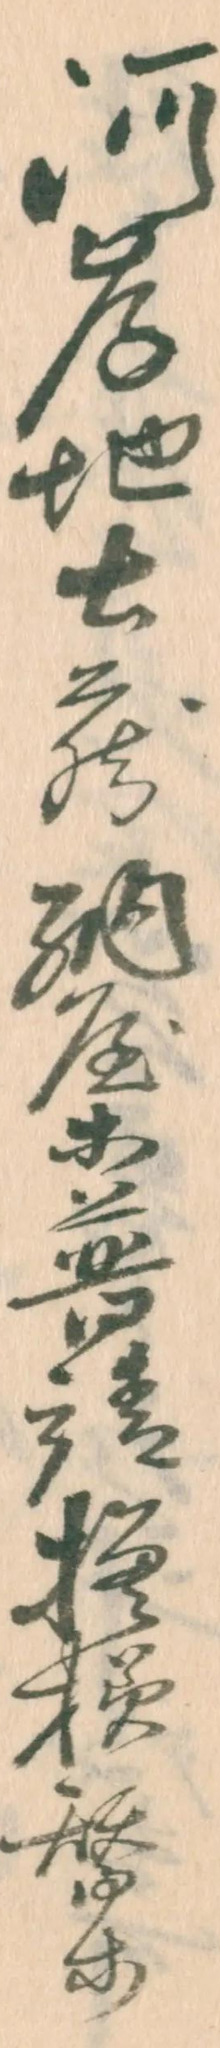河岸地土蔵納屋等普請模様替等
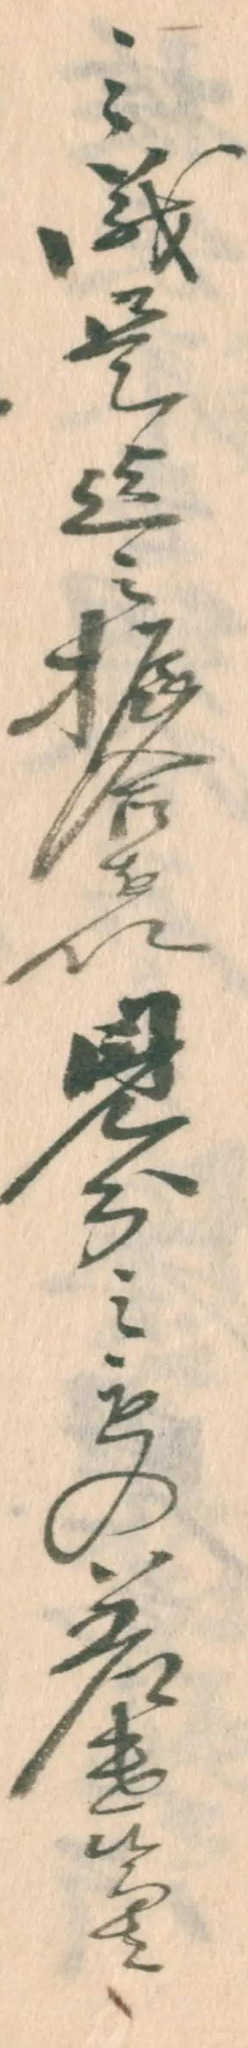之儀是迄之振合を以見分之もの差遣候而は
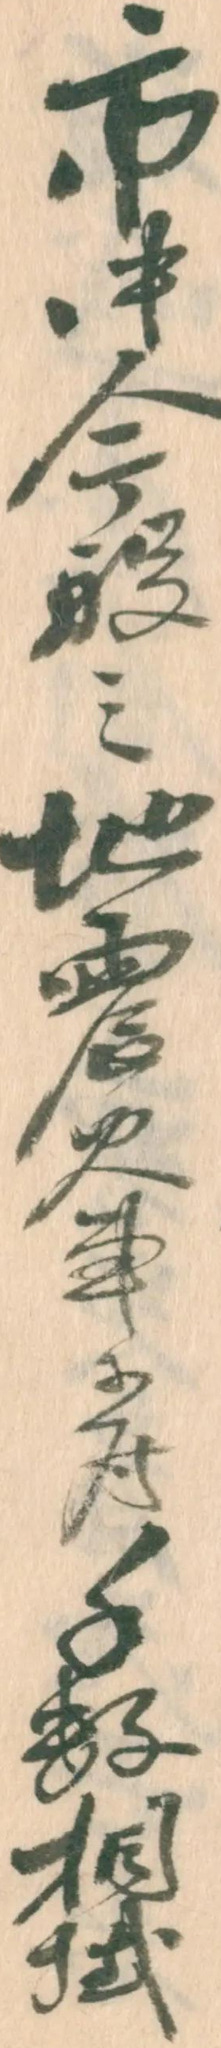市中今般之地震火事に付手数相掛

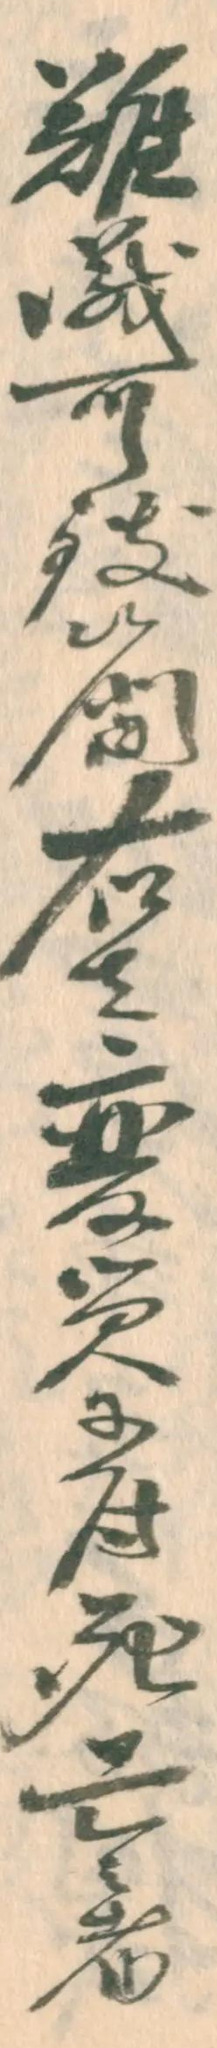難儀可致候間右は変災に付死亡之者
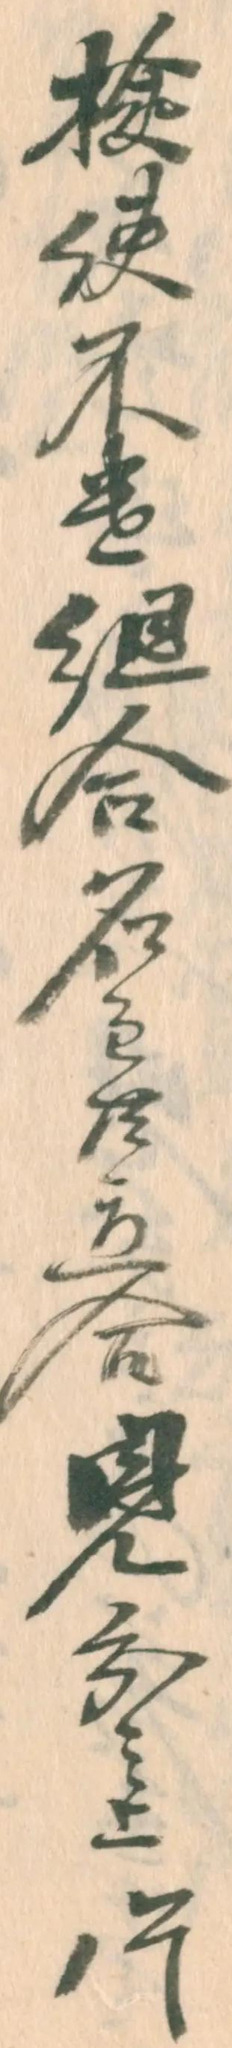検使不遣組合名主共立合見分之上片
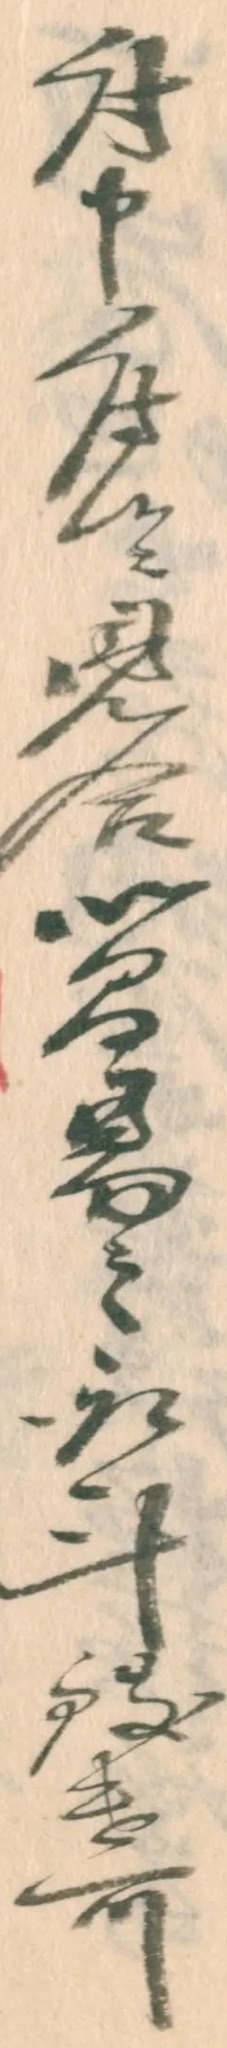付申ニ付候ニ見合簡易之取計致遣可
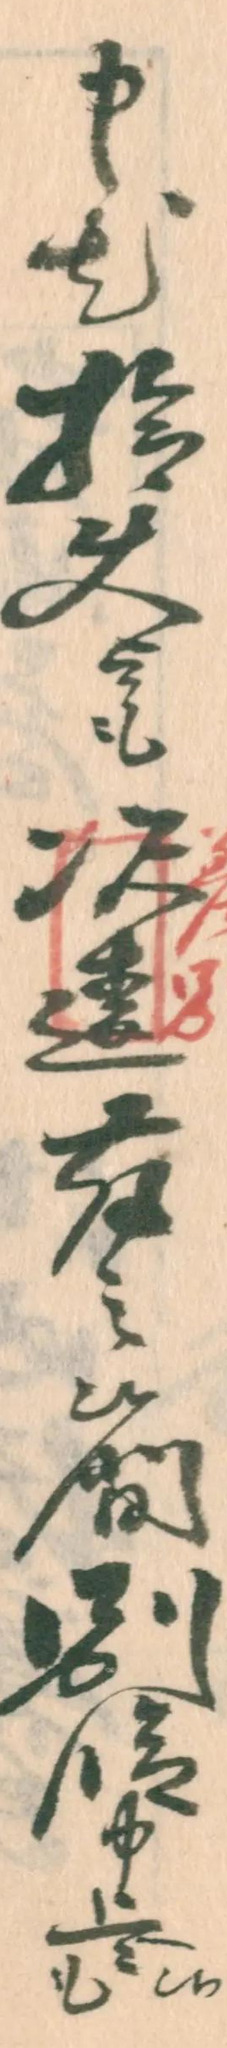申尤検使とも有之候間別段申上候ニも
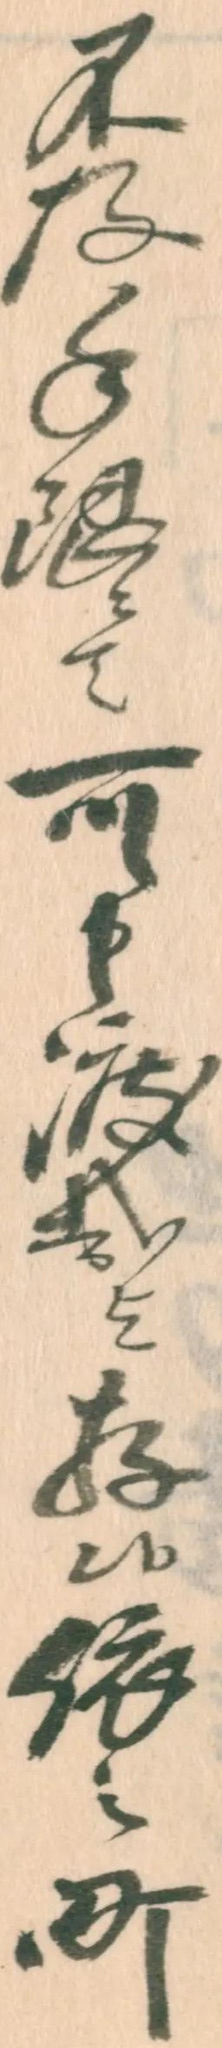不及手限ニは可申渡哉と存候依之町
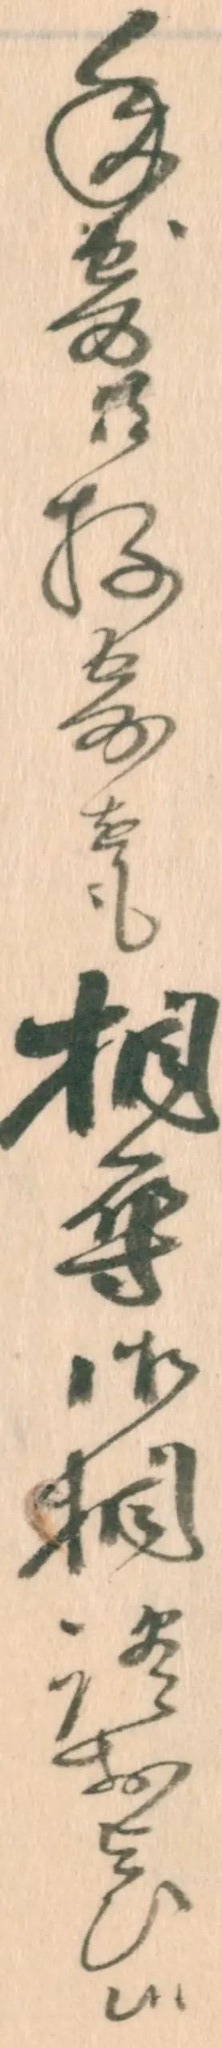年寄共存寄をも相尋御相談およひ候
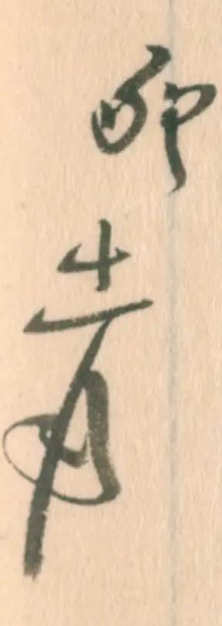卯十一月
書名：地震災書留 2巻. [1] 内表紙に「地震災書留　安政二卯年　但本所深川御用屋敷地代免除調」とあり
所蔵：国立国会図書館 National Diet Library, JAPAN
